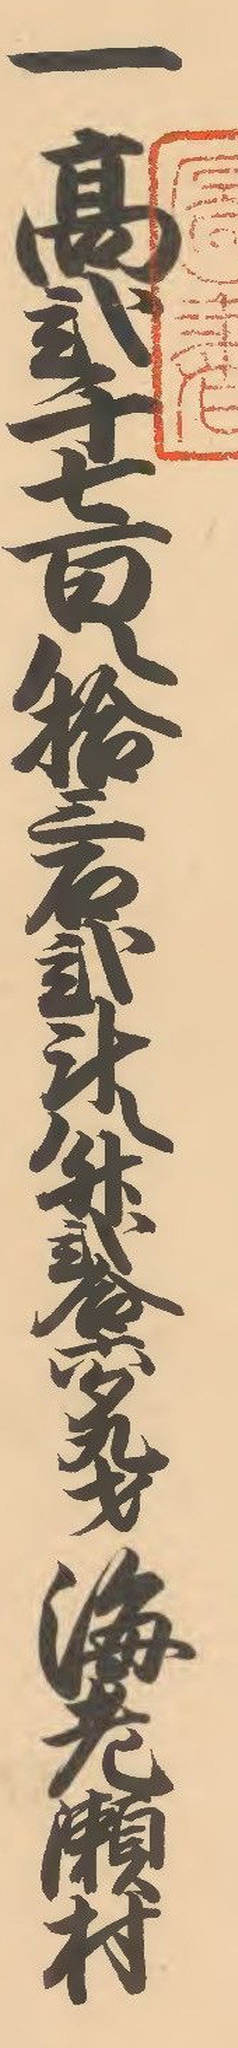一髙弐千七百八拾三石弐斗八升弐合六夕九才海老瀬村
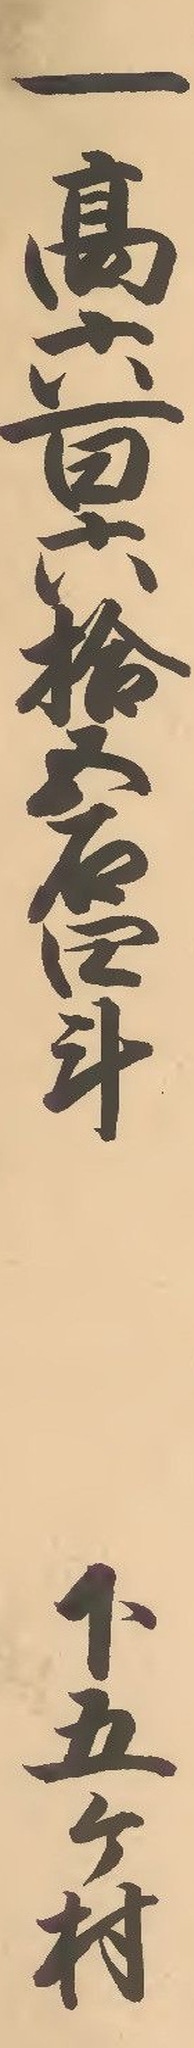一髙六百六拾五石四斗下五ケ村

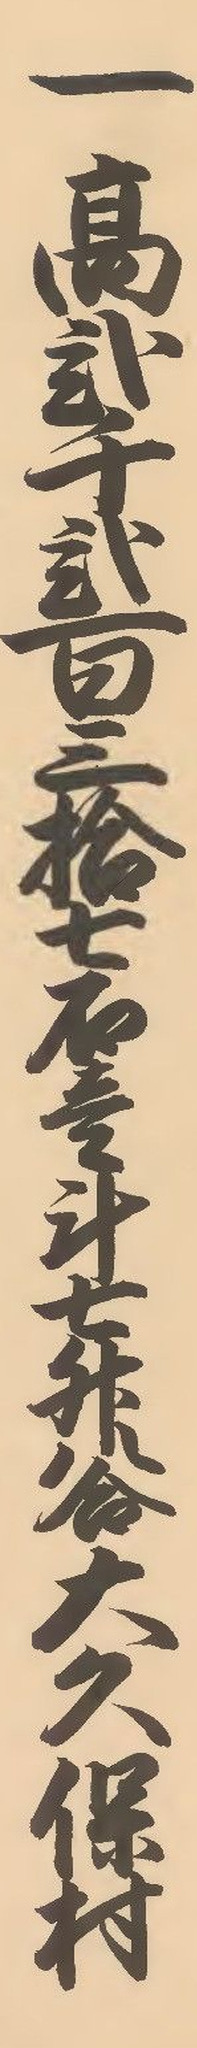一髙弐千弐百三拾七石壱斗七升八合大久保村
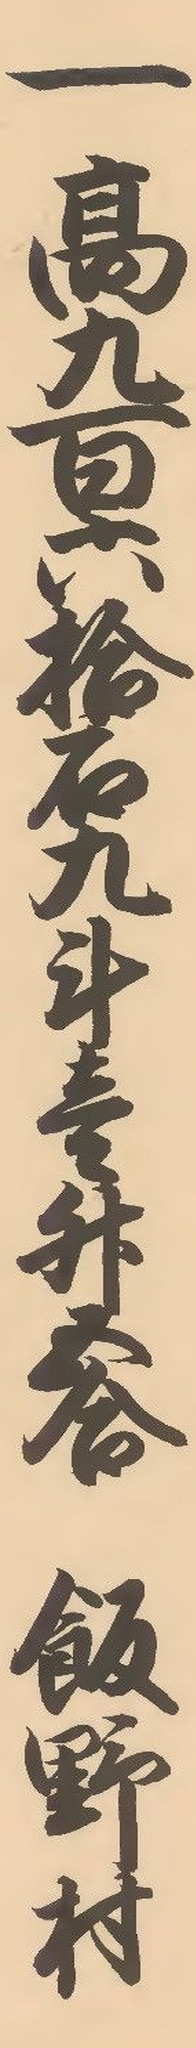一髙九百六拾石九斗壱升五合飯野村
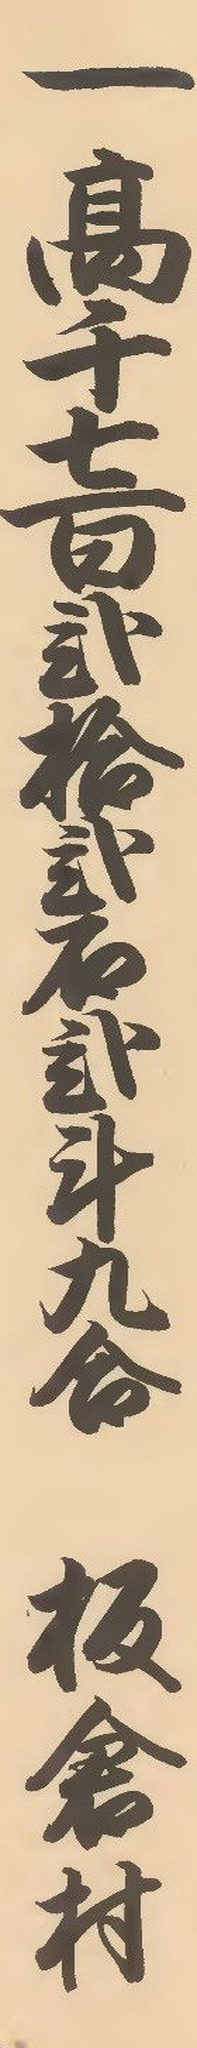一髙千七百弐拾弐石弐斗九合板倉村
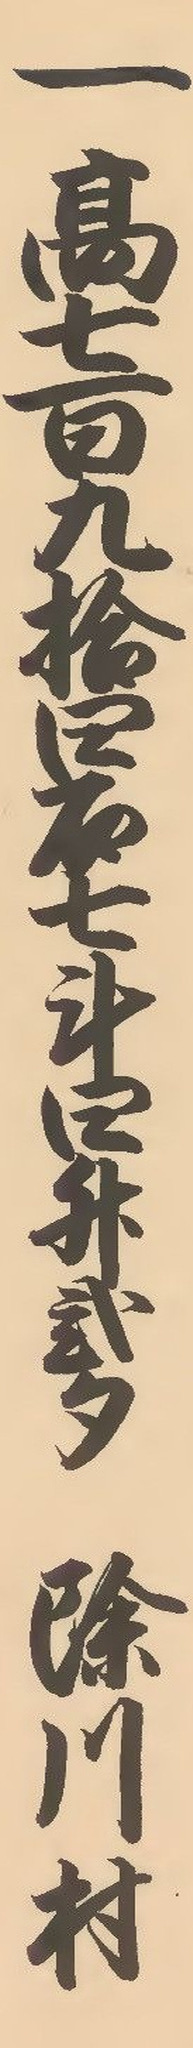一髙七百九拾四石七斗四升弐夕除川村
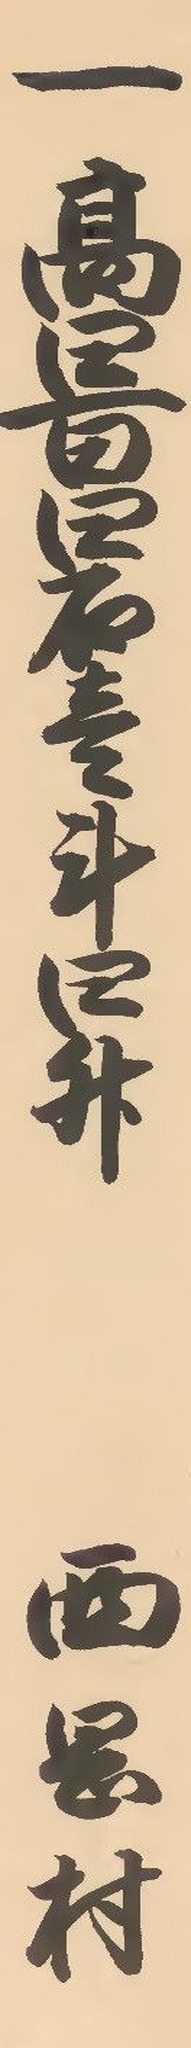一髙四百四石壱斗四升西岡村
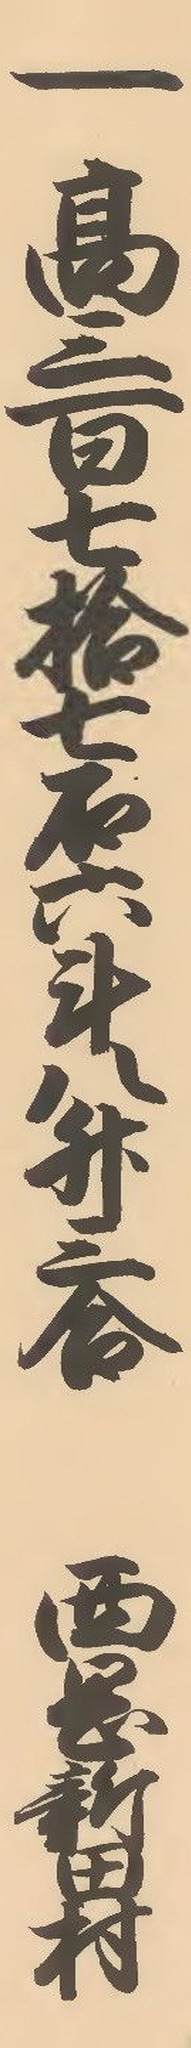一髙三百七拾七石六斗八升三合西岡新田村
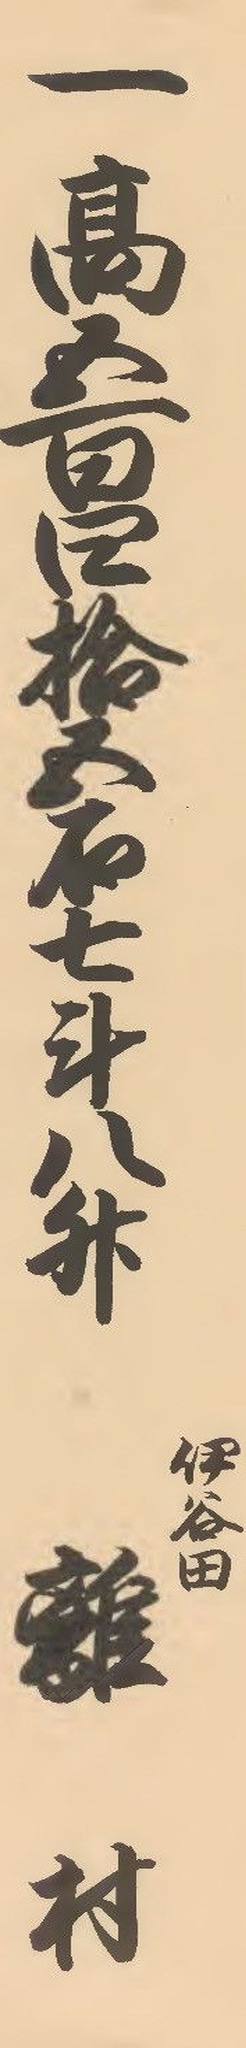一髙五百四拾五石七斗八升離村
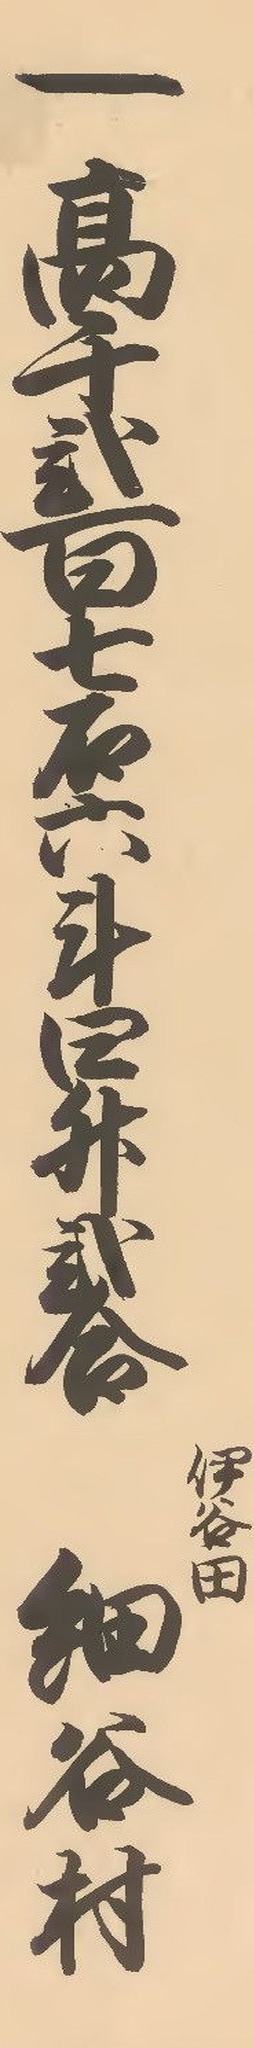一髙千弐百七石六斗四升弐合細谷村

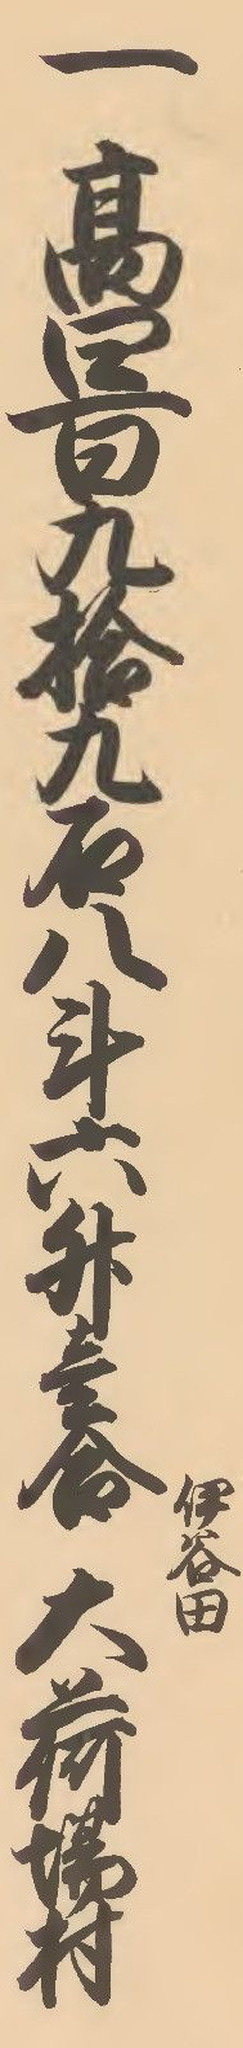一髙四百九拾九石八斗六升壱合大荷場村
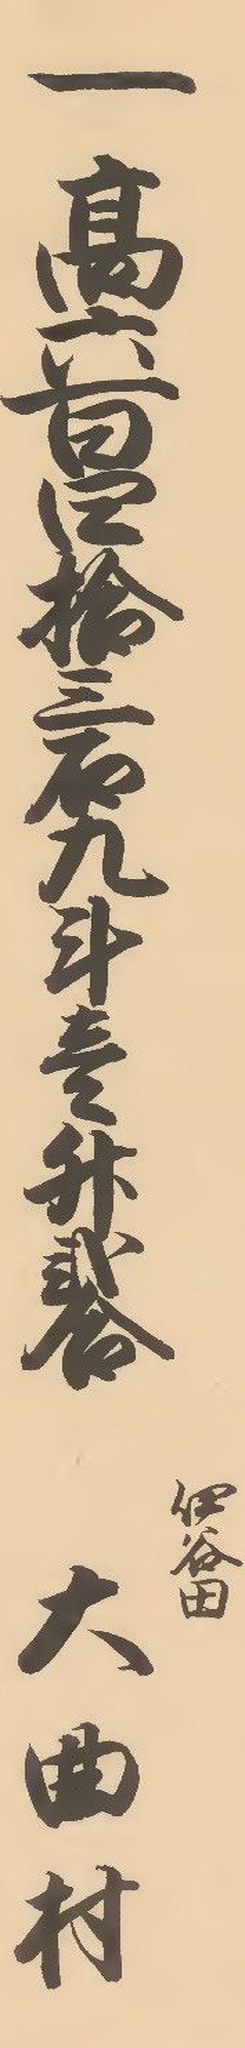一髙六百四拾三石九斗壱升弐合大曲村
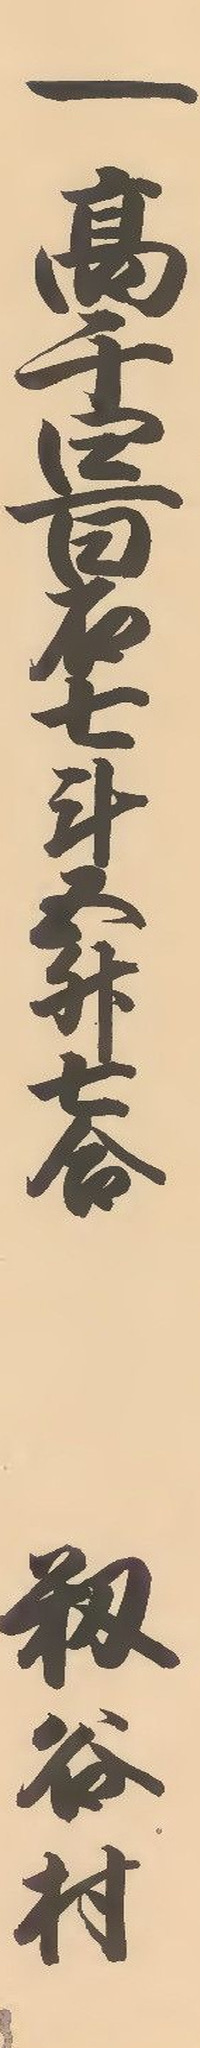一髙千四百石七斗五升七合籾谷村
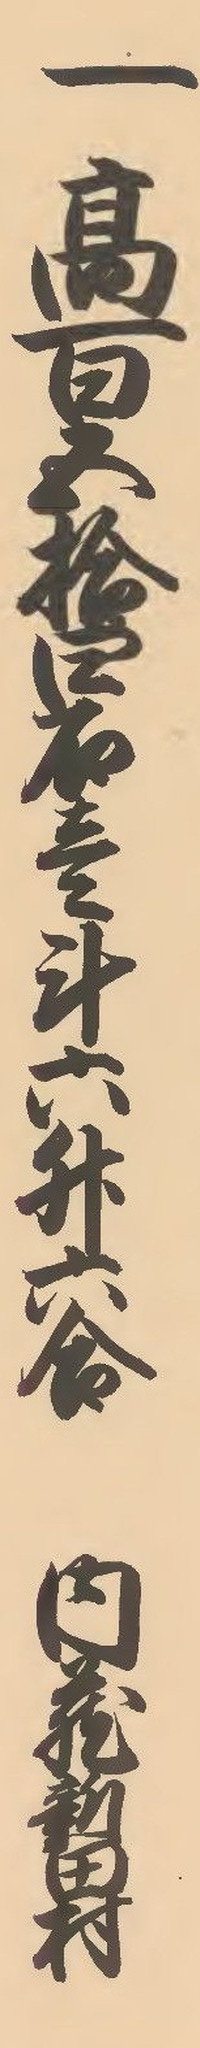一髙百五拾四石壱斗六升六合内藏新田村
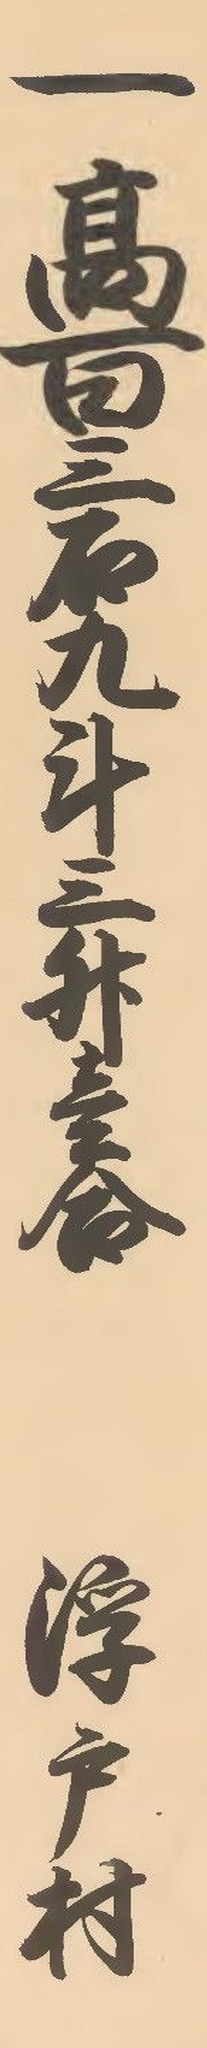一髙百三石九斗三升壱合浮戸村
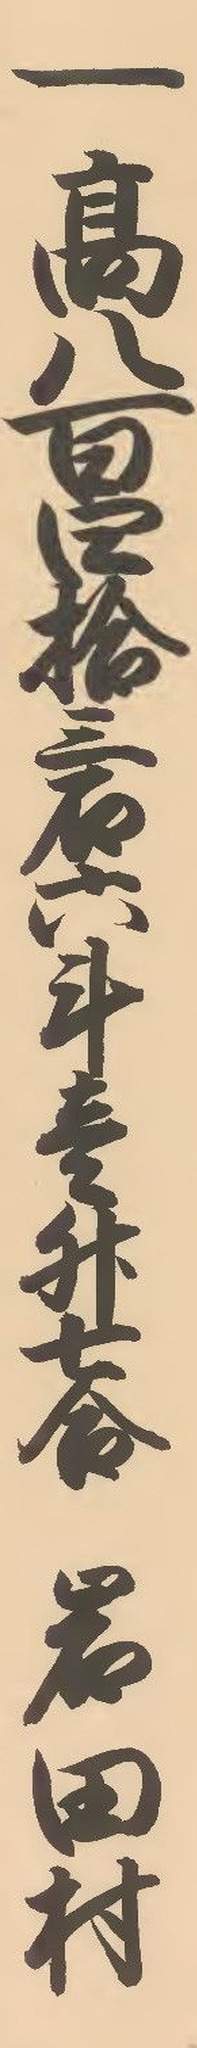一髙八百四拾三石六斗壱升七合岩田村
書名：上野国郷帳
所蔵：国立公文書館 National Archives of Japan
